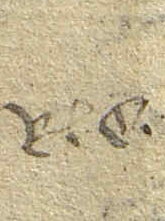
R . C .
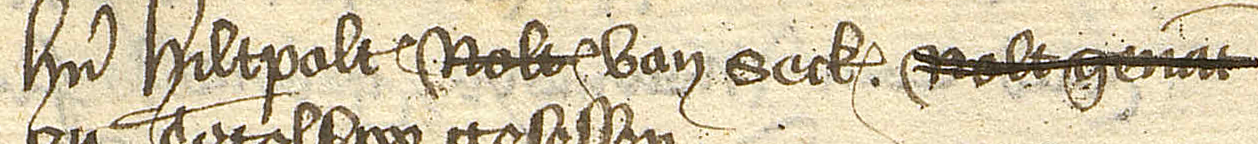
hn* hiltpolt* Nolt* von Seck* . Nolt genat*
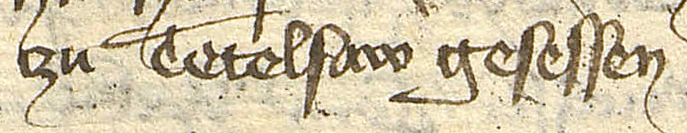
cʒu Tetelſaw geſeſſen
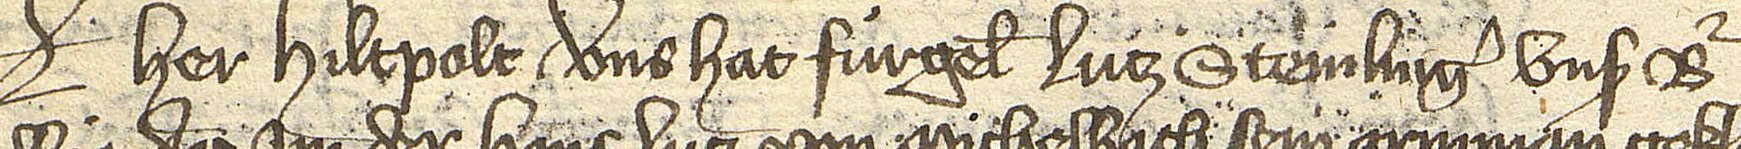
L* her hiltpolt / Vns hat fürgel* Lucʒ Steinling* vnſ* B*
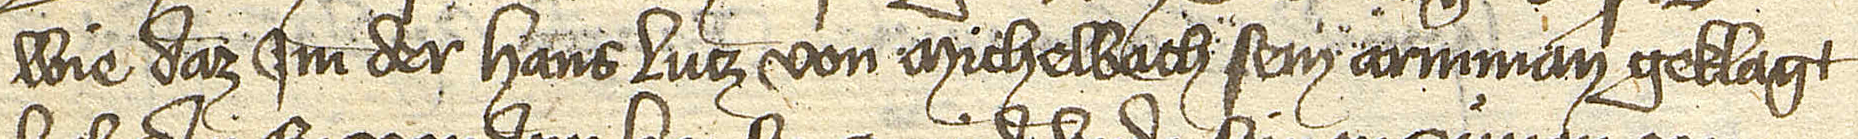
wie daʒ Im der hans Lucʒ von Michelbach ſein armman geklagt
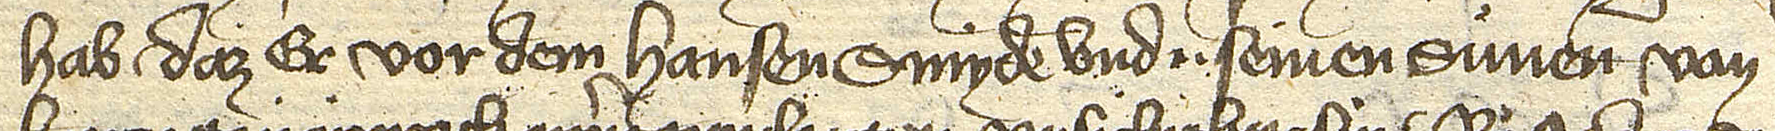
hab / daʒ Er vor dem hanſen Smyde vnd ~ ſeinen Sünen von
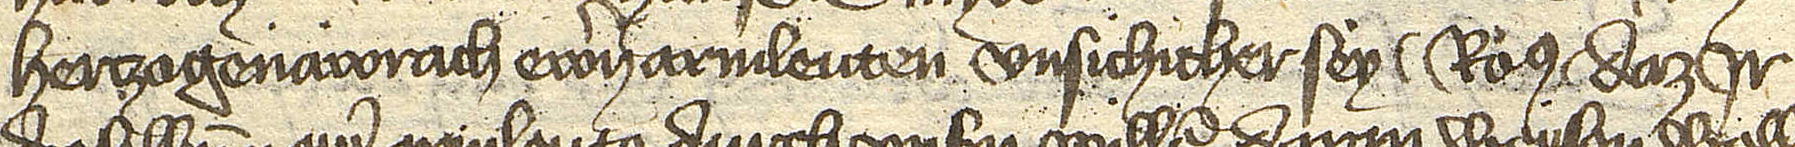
hercʒogenawrach ewn* armleuten vnſichicher ſey / Ro* / daʒ Ir
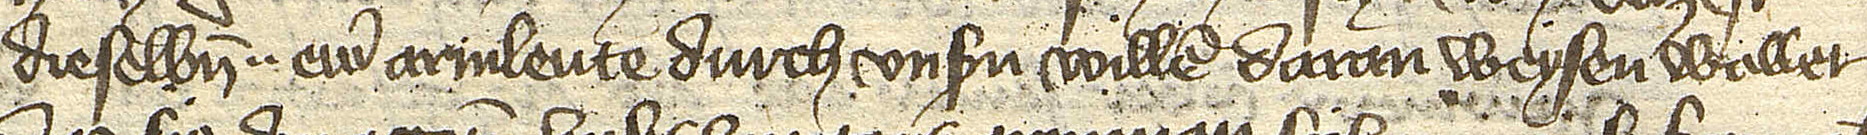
dieſelbn* ~ ew* armleute durch vnſ*n wille* daran weyſen wöllet
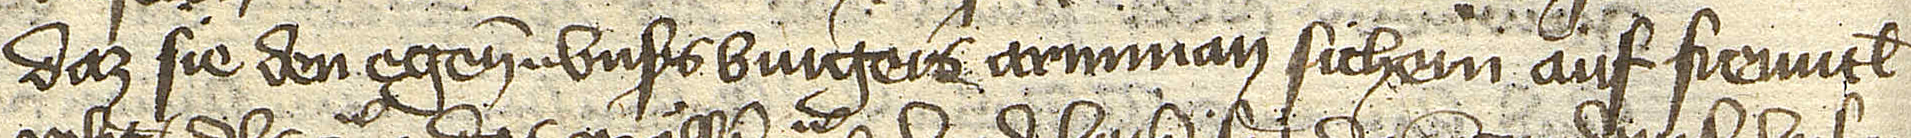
daʒ ſie den egen* ~ vnſ*s burgers armman ſichern auf freuntl*
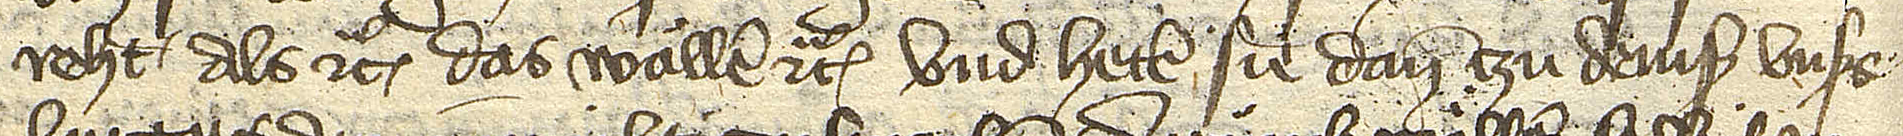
reht / Als ec* das wölle* ec* vnd hete* ſie dan* cʒu demſ* vnſ*s
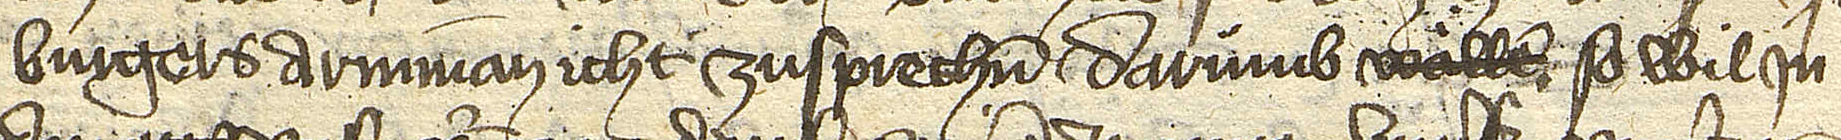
burgers Armman* icht cʒuſprechn* / darümb wölle* ſo wil In
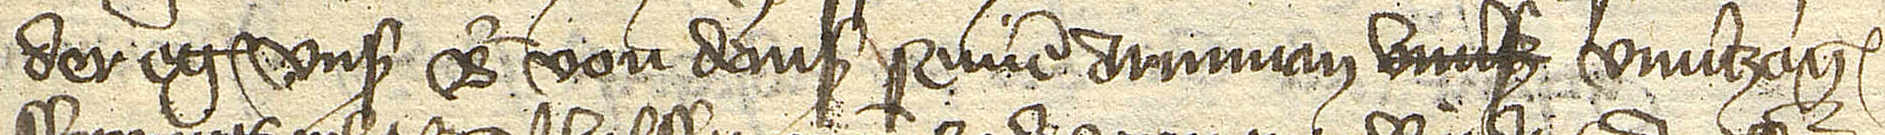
der eg* vnſ* B* von demſ* ſeine* Armman vnu*ſʒ vnu*cʒog*
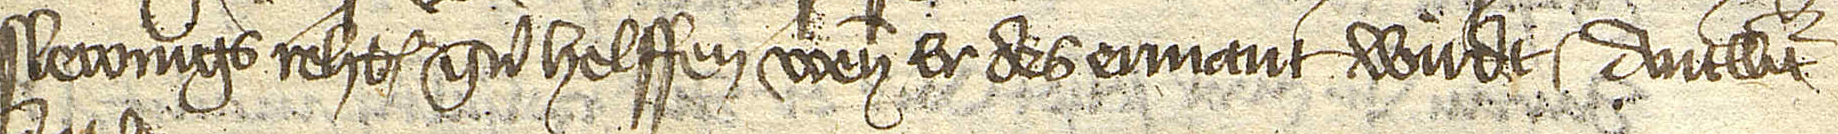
ſlewnigs reht* gn* helffen wen* Er des ermant wirdt / Antw*t
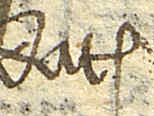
Dat*
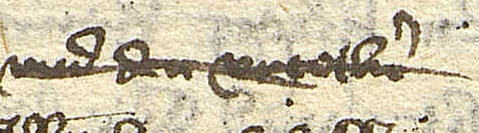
vnd den vrteiln*
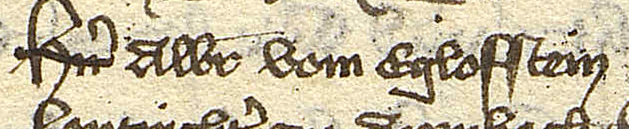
hn* Albr* vom Eglofſein
